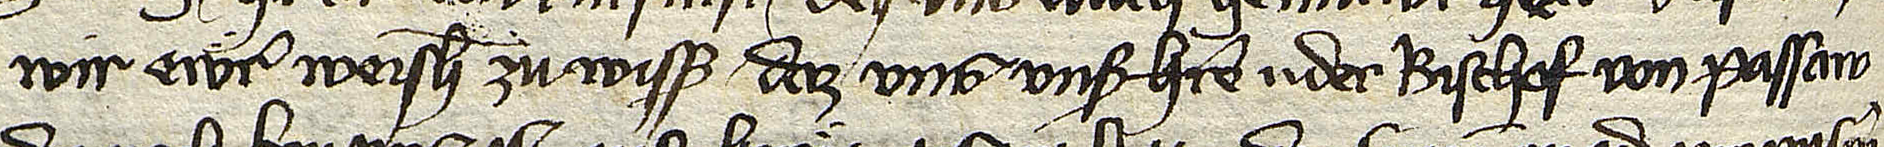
wie eẅr* weiſh* ʒu wiſſ* / daʒ vns vnſ* hr*e ~ der Biſchof von Paſſaw
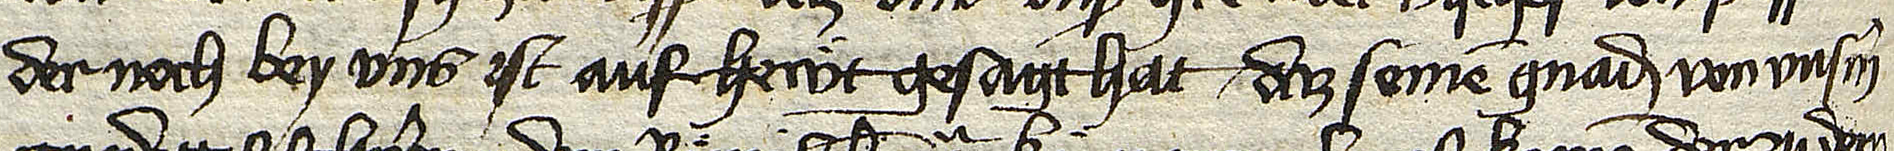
der noch bey vns iſt auf heẅt geſagt hat / daʒ ſeine* gnad* von vnſm*
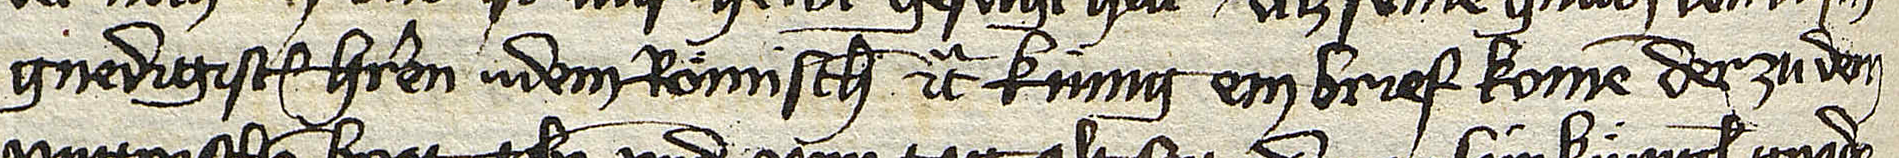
gnedigiſt* hr*en ~ dem Römiſch* ec* künig ein brief kome* der ʒu dem
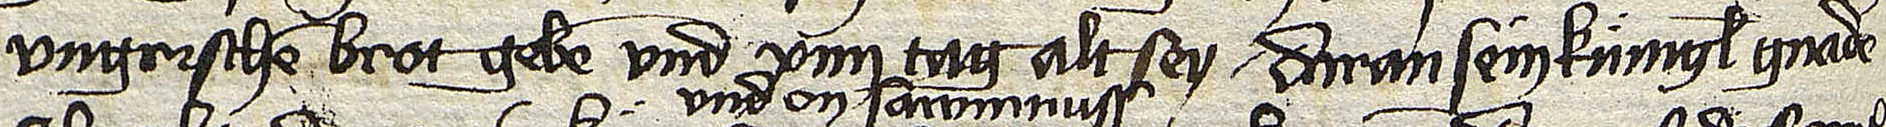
vngriſche* brot gebe* vnd xiiii tag alt ſey / daran ſein künigl* gnade
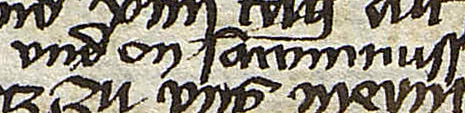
vnd on ſawmnuſſ
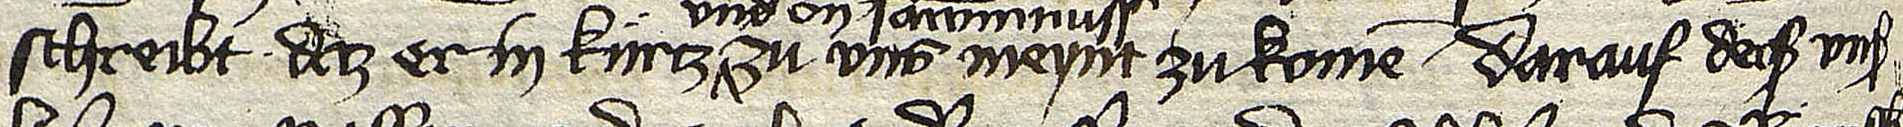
ſchreibt daʒ er in kürcʒ ʒu vns meynt ʒu kome* / Darauf derſ* vnſ*
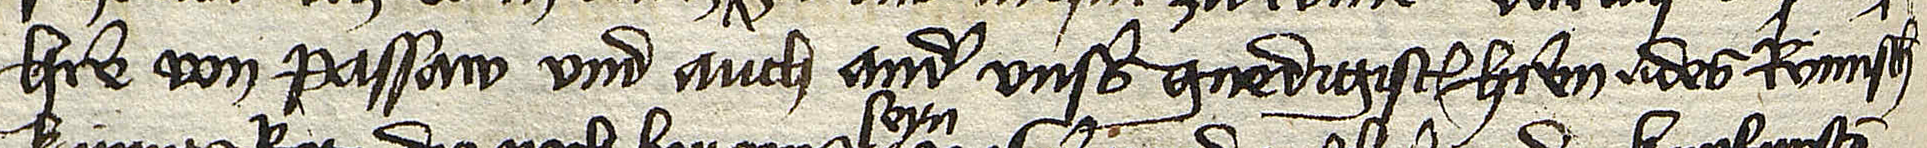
hr*e von paſſaw vnd auch and* vnſs* gnedigiſt* hr*en ~ des Römiſch*
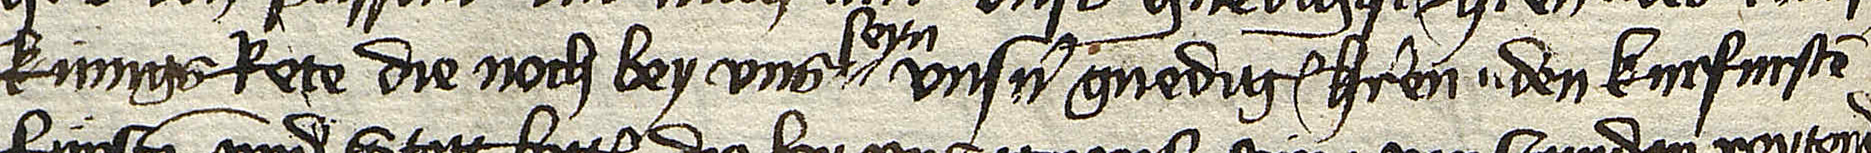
künigs Rete die noch bey vns vnſn* gnedig* hr*en ~ den kurfurſte*
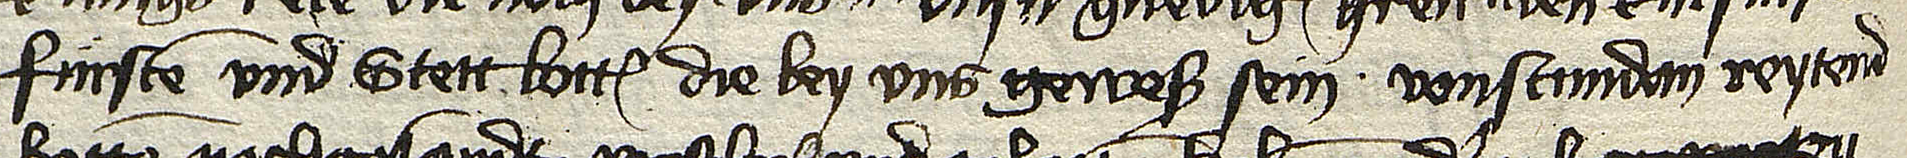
fürſte* vnd Stett bott* die bey vns geweſ* ſein von ſtundan reytend
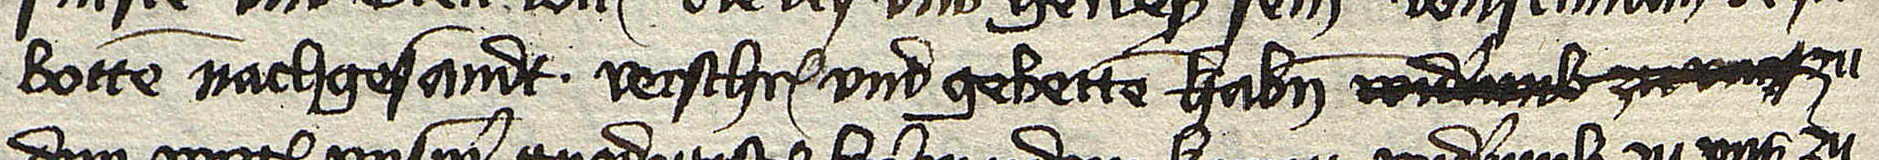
botte* nachgeſandt . verſchr* vnd gebette* habn* wid*umb ʒu %%% ʒu
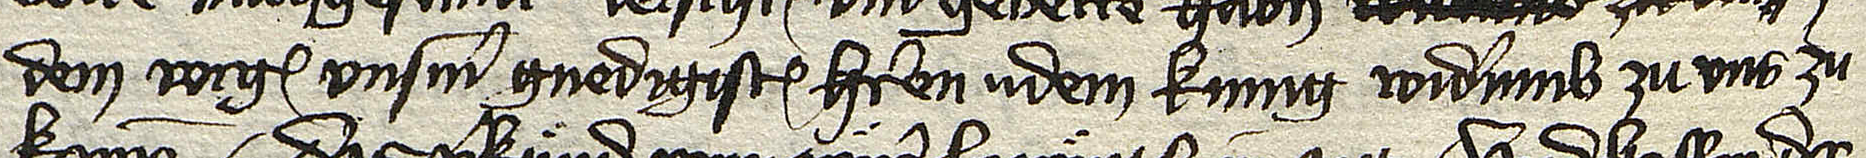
den vorg* vnſm* gnedigiſt* hr*en ~ dem kunig wid*umb ʒu vns ʒu
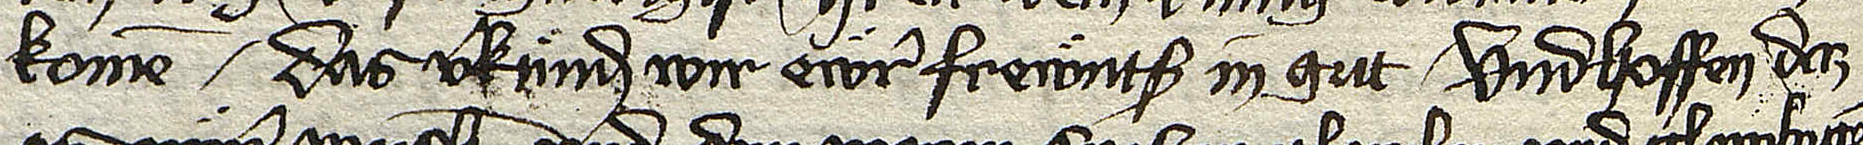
kome* / das v*künd* wir eẅr* freẅntſ* in gut / Vnd hoffen daʒ
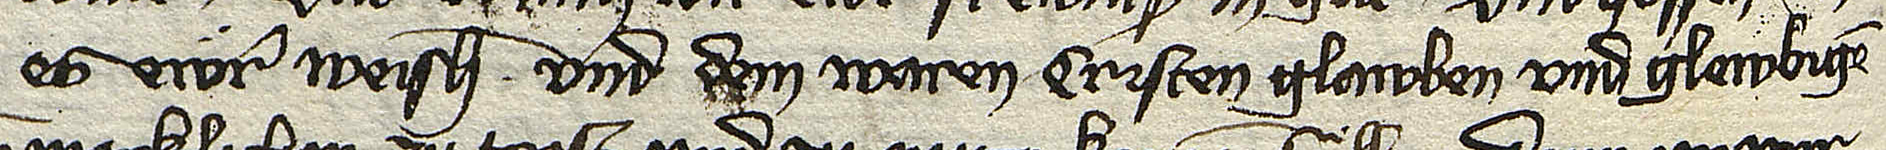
es eẅr* weiſh* . vnd dem waren Criſten gelawben vnd glewbige*
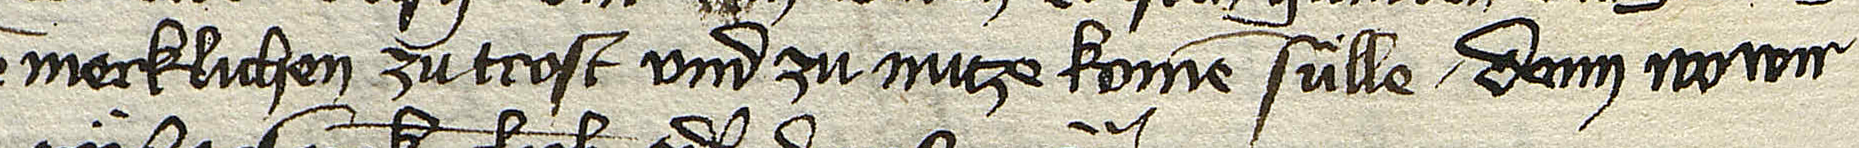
merklichen ʒu troſt vnd ʒu nucʒe kome* ſülle / Denn wo wir
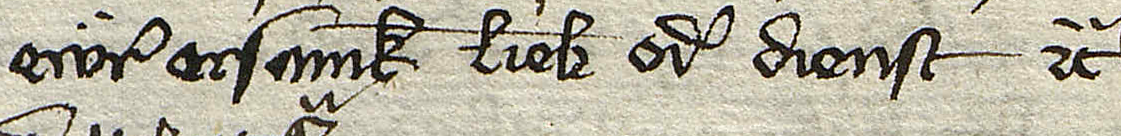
eẅr* erſamk* lieb od* dienſt ec*
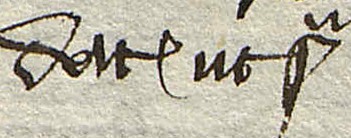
Dat* ut ſ*
